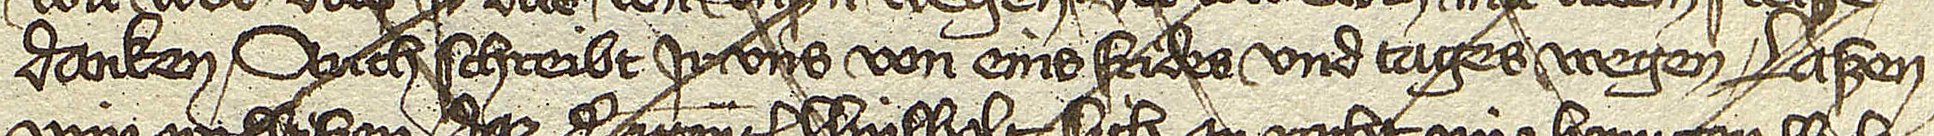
danken / Auch ſchreibt Ir vns von eins fride vnd tages wegen / Laſʒen
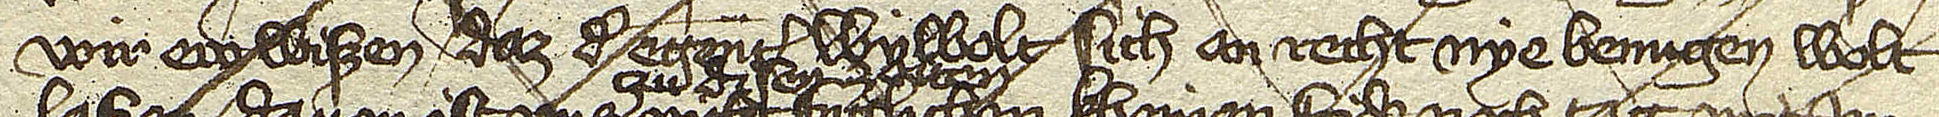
wir ew wiſʒen / daʒ d* egen*t* Wylbolt ſich an recht nye benugen wolt
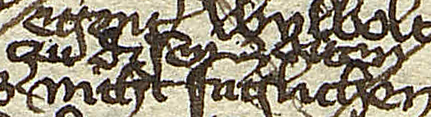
cʒu diſen ʒeiten
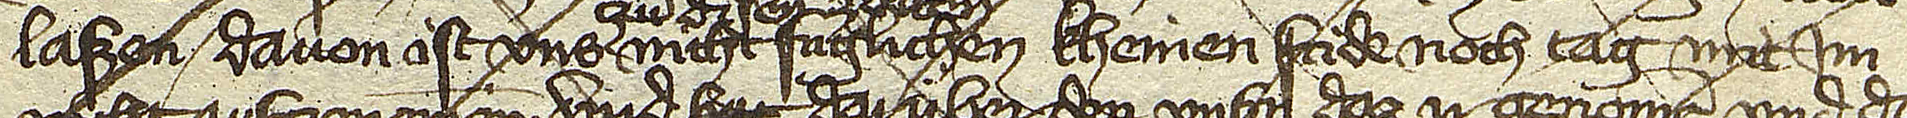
laſʒen / dauon iſt vns nicht fuglichen kheinen fride noch tag mit Im
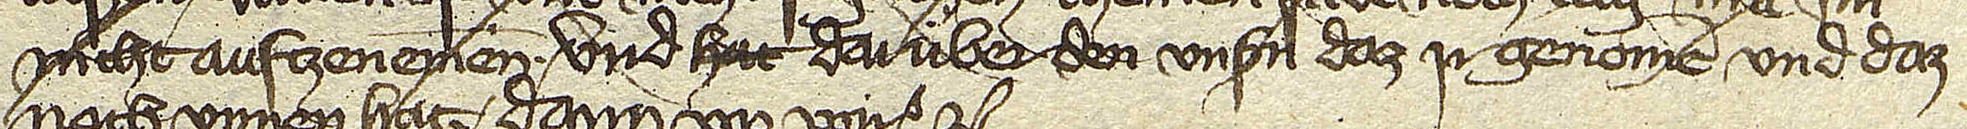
nicht aufcʒenemen . / vnd hat darüber den vnſ*n daʒ Ir genome* vnd daʒ
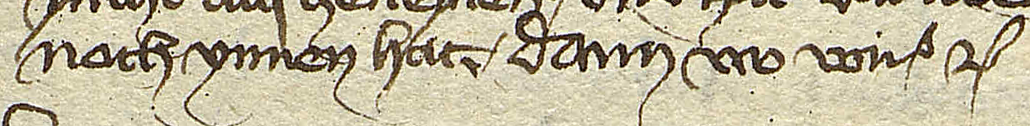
noch ynnen hat . / dann wo wir* ec*
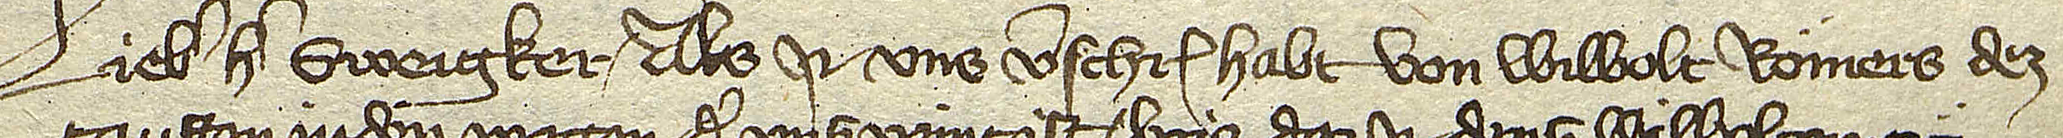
Lieb* h* Sweigker / Als Ir vns v*ſchr* habt von Wilbolt Römers deʒ
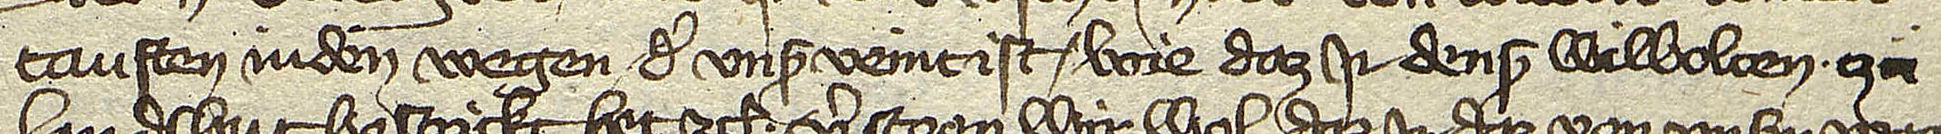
tauften iuden wegen / d* vnſ* veint iſt / wie daʒ Ir denſ* wilbolten cʒü
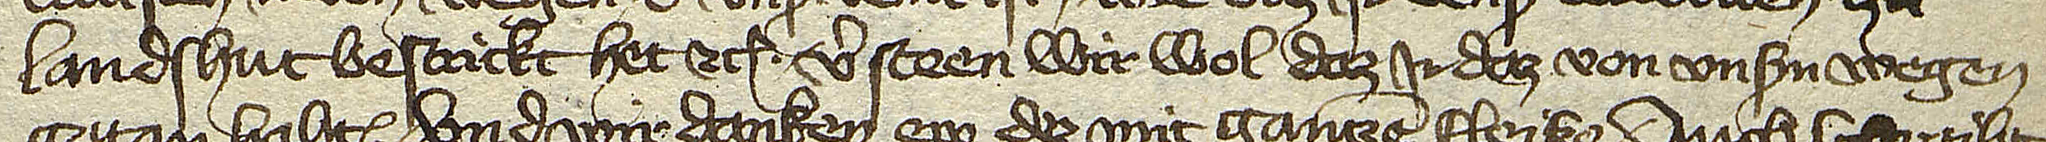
landſhut beſtrickt het ec* . / v*ſteen wir wol daʒ Ir daʒ von vnſ*n wegen
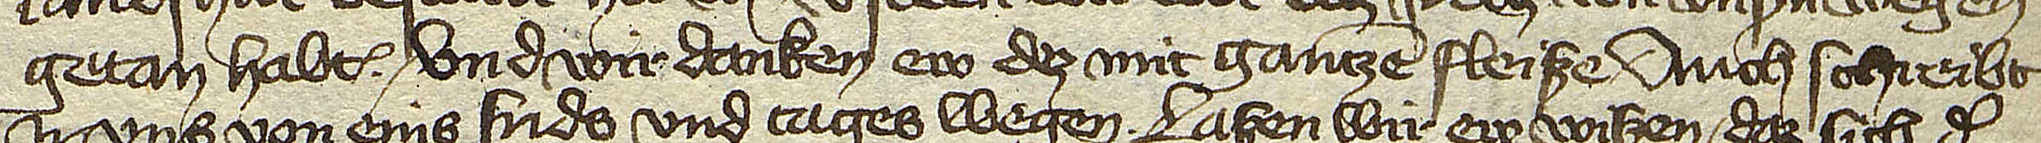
getan habt* . / vnd wir danken ew deʒ mit gancʒe* fleiſʒe / Auch ſchreibt
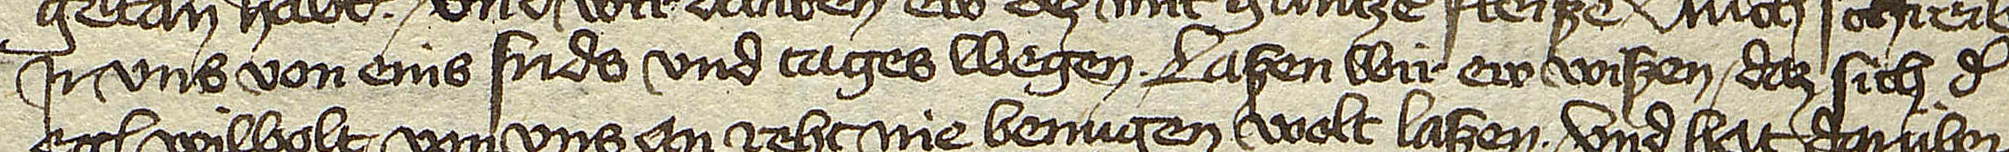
Ir vns von eins frids vnd tages wegen . / Laſʒen wir ew wiſʒen / daʒ ſich d*
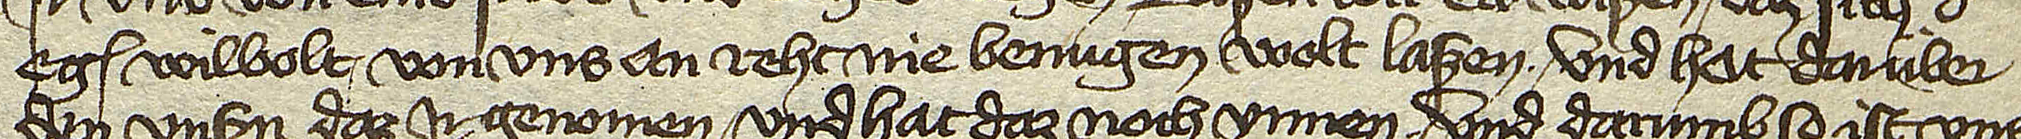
eg* wilbolt von vns an reht nie benugen wolt laſʒen / vnd hat darüber
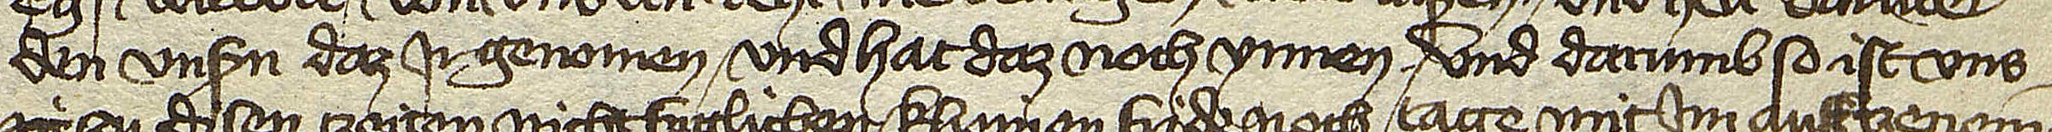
den vnſ*n daʒ Ir genomen / vnd hat daʒ noch ynnen . / vnd darumb ſo iſt vns
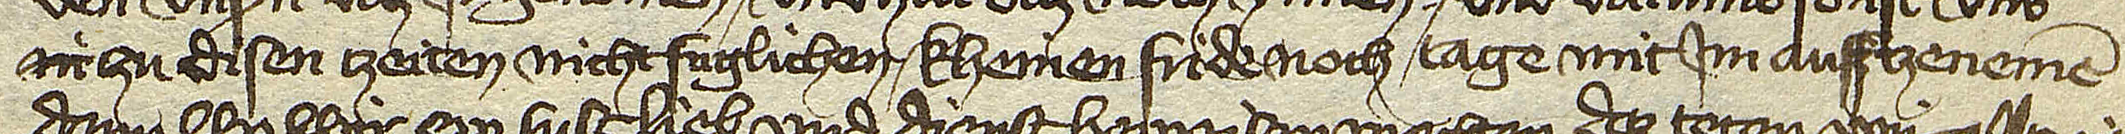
ni cʒu diſen cʒeiten nicht fuglichen / kheinen fride noch tage mit Im auffcʒeneme*
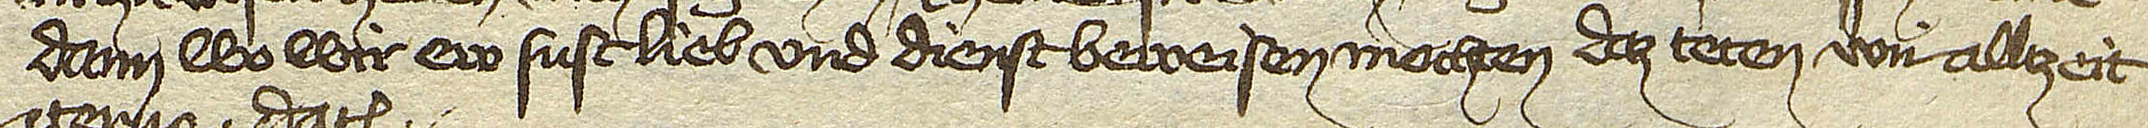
dann wo wir ew ſuſt lieb vnd dienſt beweiſen mochten daʒ teten wit allcʒeit
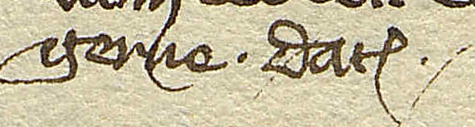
gerne . Dat* . /
